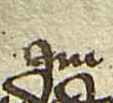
Im
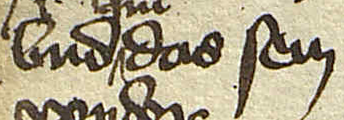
vnd das ſein
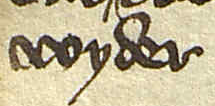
wyder
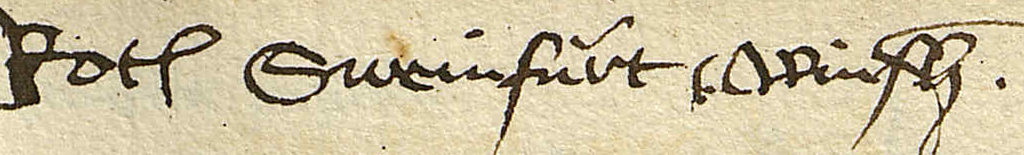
Rot* Sweinfürt / winſh .
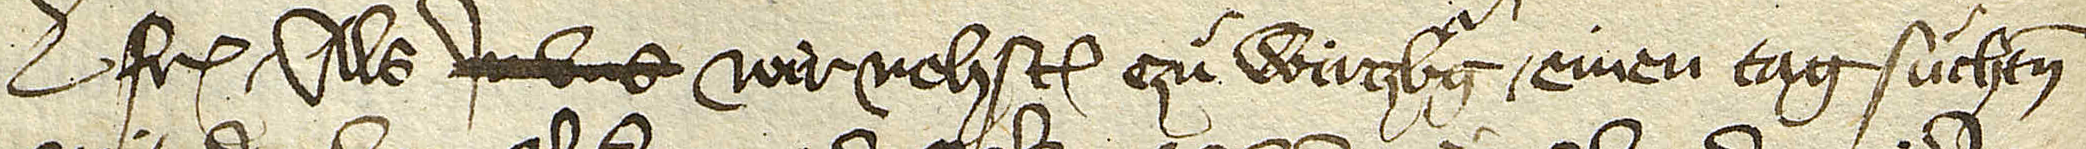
L* fr* / Als Ir vns wir nehſt* cʒu wircʒb*g / einen tag ſüchtn*
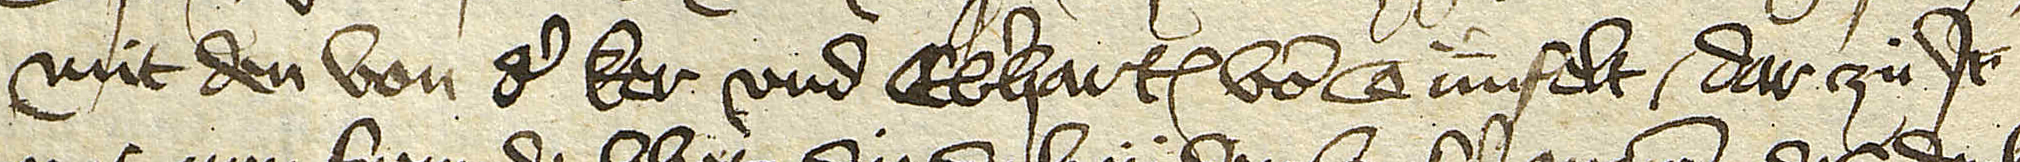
mit den von d* ker vnd Eb*hart* vo* Tünfelt / dar cʒü Ir
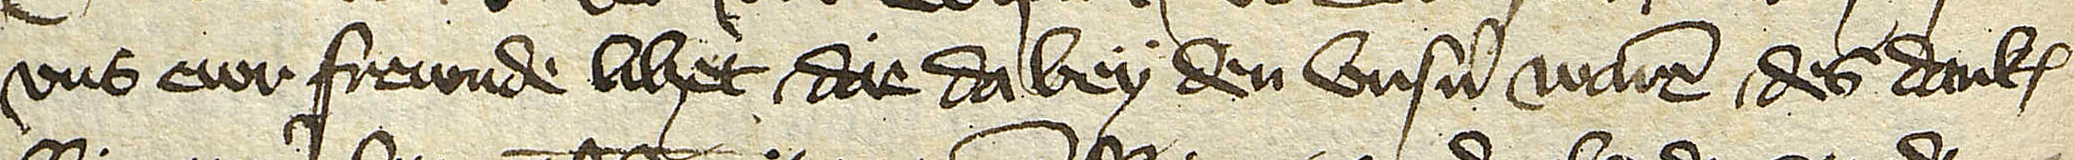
vns ewr frewnde lihet / die dabey den vnſn* ware* / des dank*
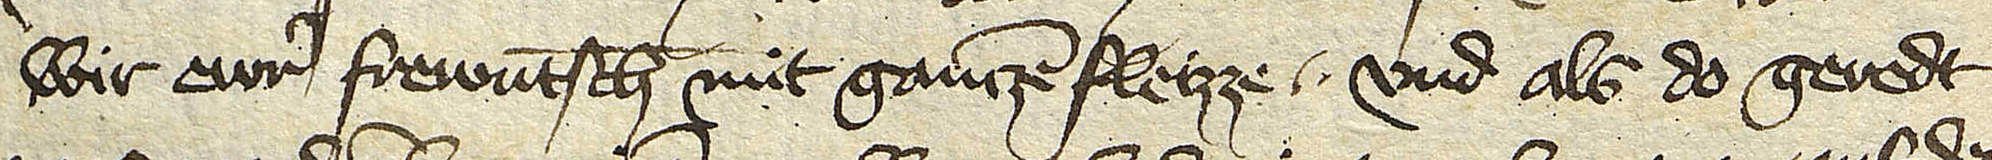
wir ewr* frewntſch* mit gancʒe* fleiʒʒe / . vnd als do geredt
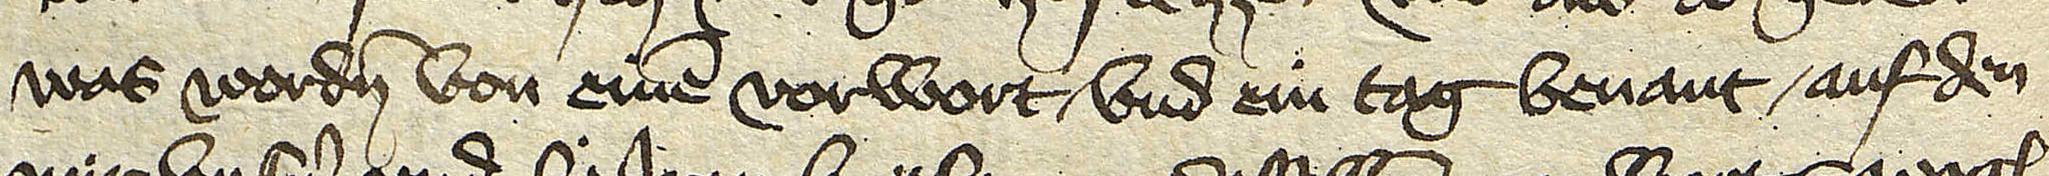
was wordn* von eine* vorwort / vnd ein tag benant / auf den
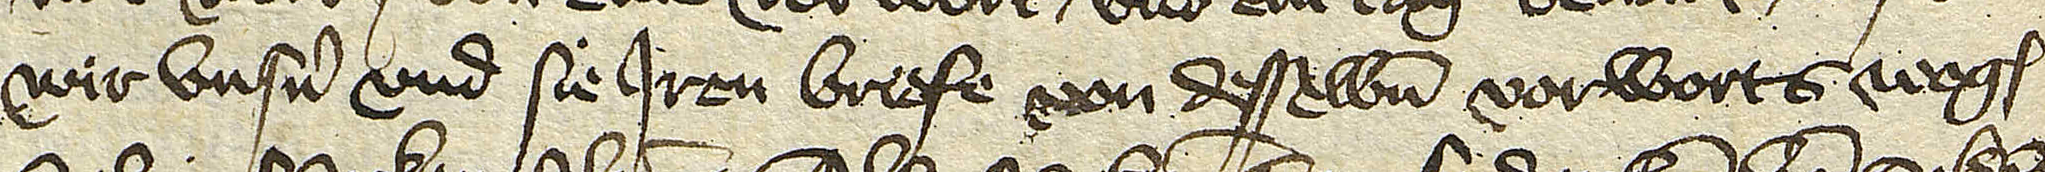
wir vnſn* vnd ſie Iren briefe von deſſelbn* vorworts weg*
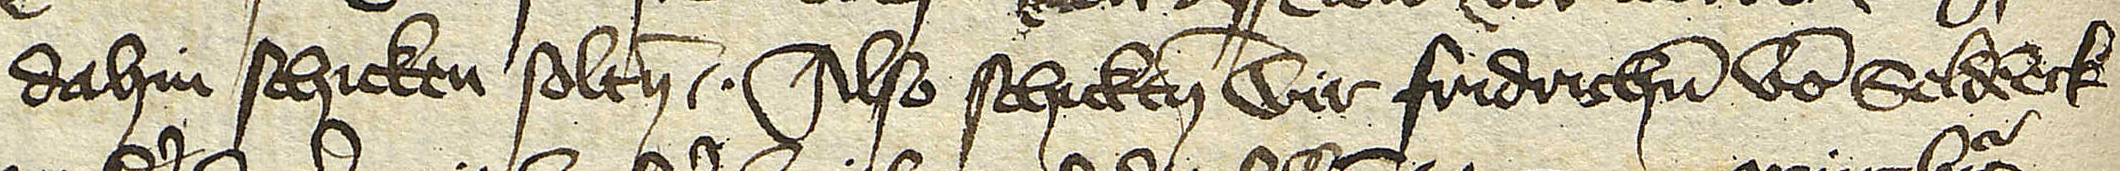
dahin ſchicken ſoltn* / . Alſo ſchicktn* wir fridrichn* vo* Selde*eck
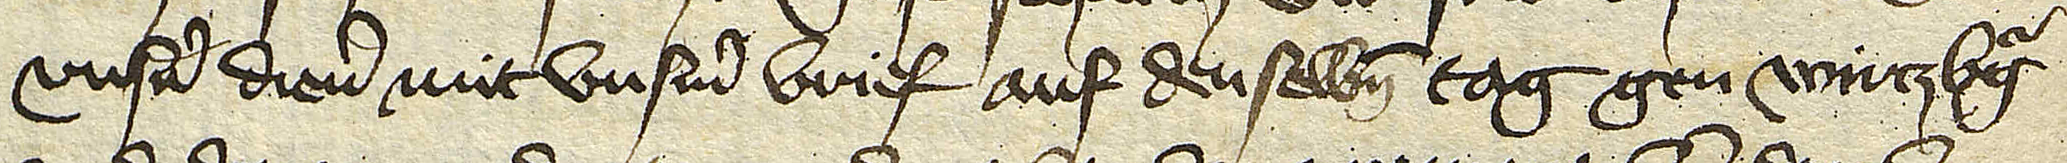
vnſn* dien* mit vnſm* brief auf denſelbn* tag gen wircʒb*g
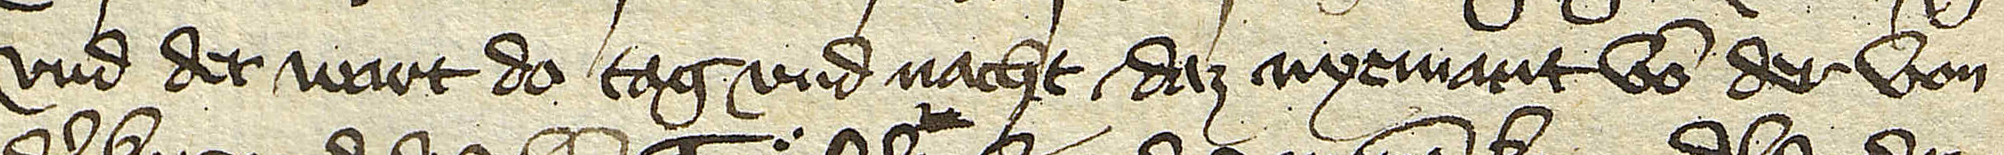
vnd der wart do tag vnd nacht / daʒ nyemant vo* der von
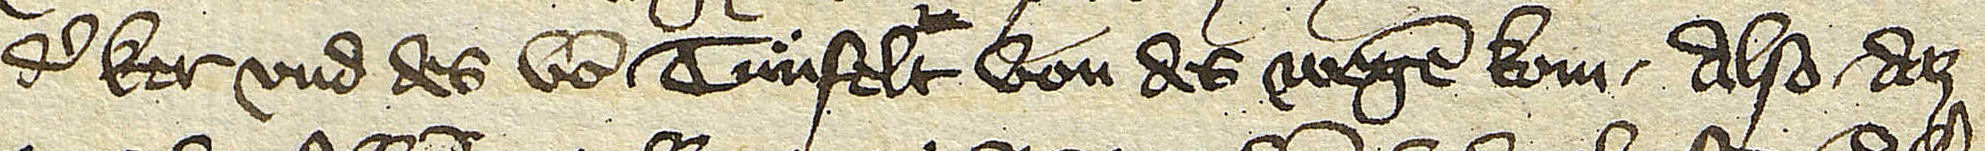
d* ker vnd des vo* Tünfelt von des wege* kom / Alſo / daʒ
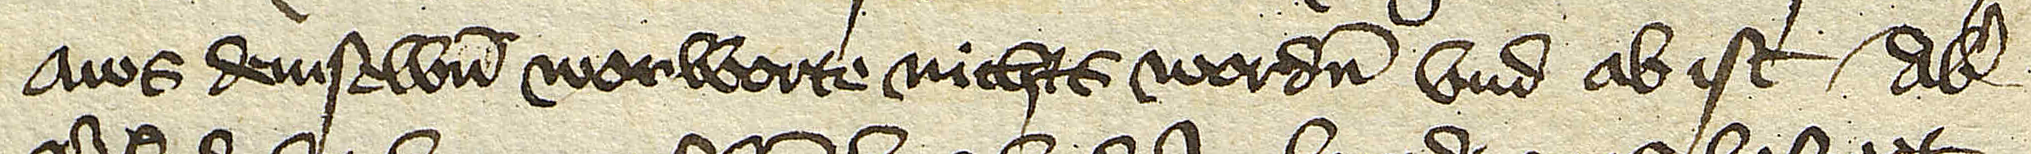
aws demſelbn* vorworte nichts wordn* vnd ab iſt / Ab*
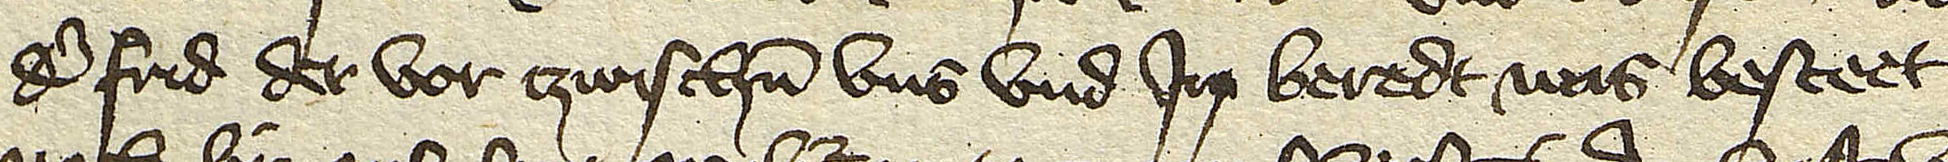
d* frid der vor cʒwiſchn* vns vnd In beredt was beſteet
